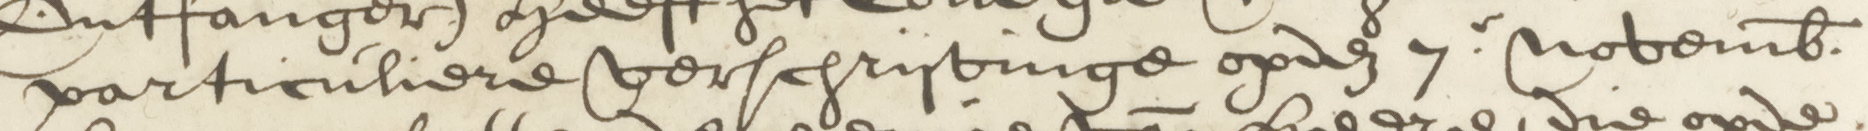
particuliere verschrijvinge opden 7e novemb
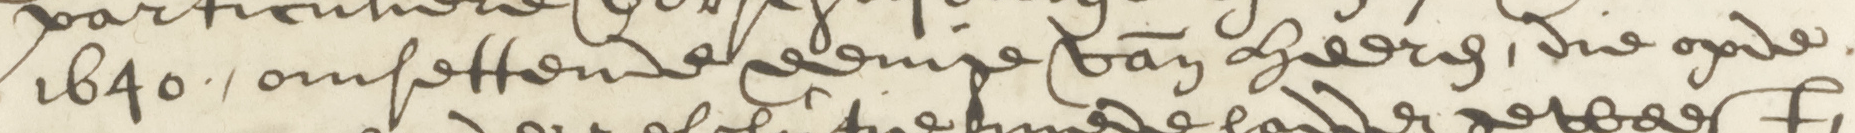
1640:, omsettende eenige van heeren, die opde
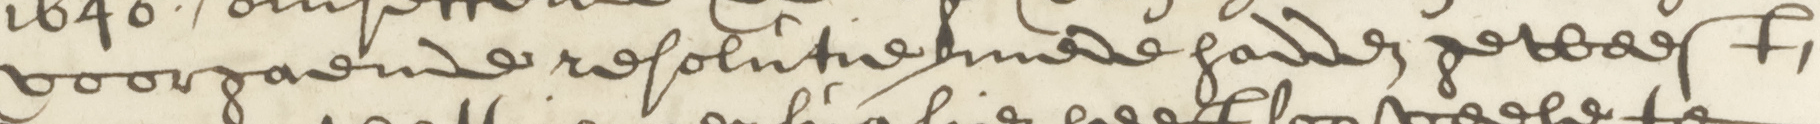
voorgaende resolutie mede hadden geweest,
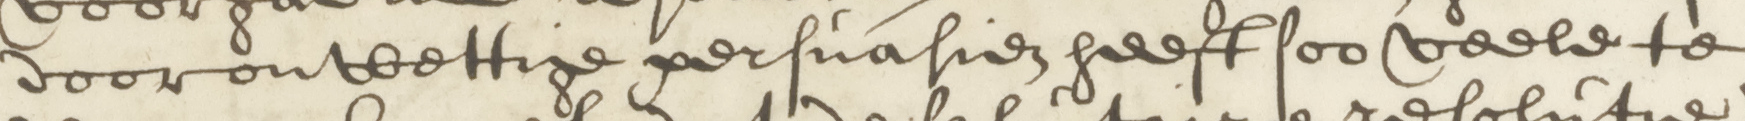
door onwettige persuasien heeft soo veele te
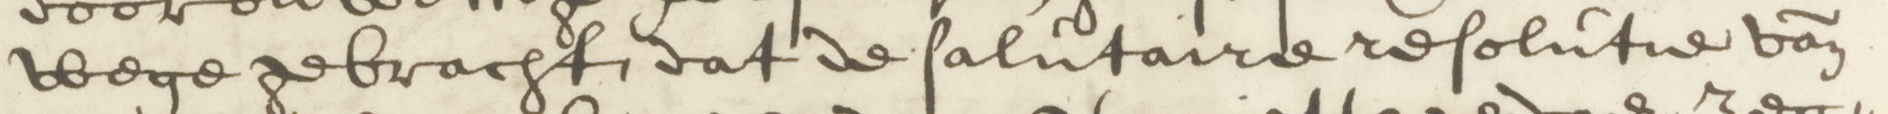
wege gebracht, dat de salutaire resolutie van
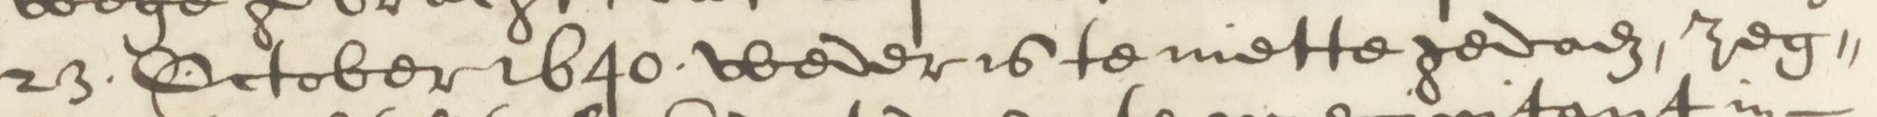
23. October 1640 weder is te niette gedaen, zeg„
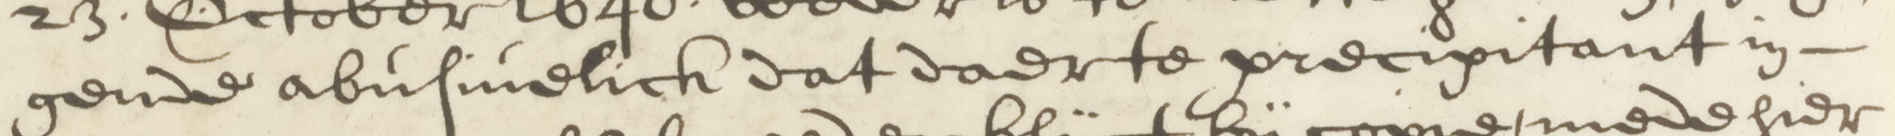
gende abusivelick dat daer te precipitant in —
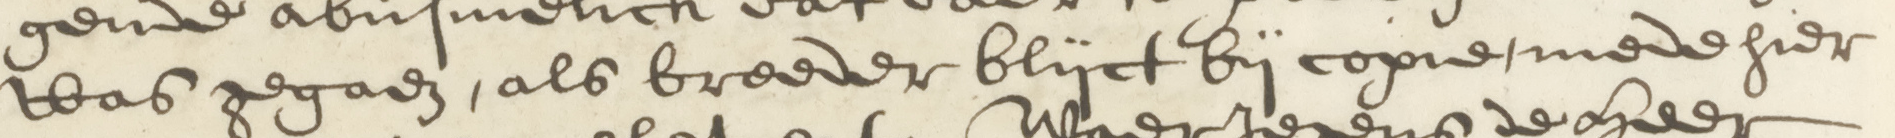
was gegaen, als breeder blijct bij copie, mede hier
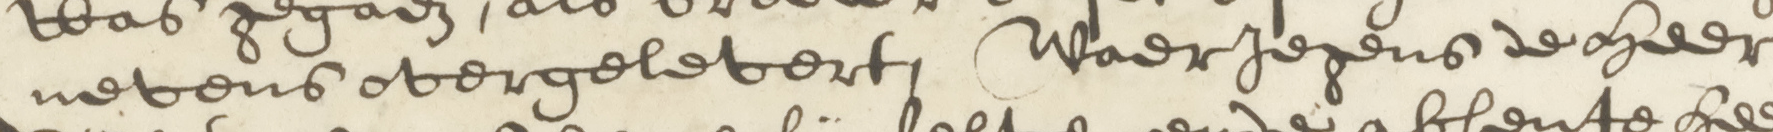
nevens overgelevert. Waer Jegens de heer
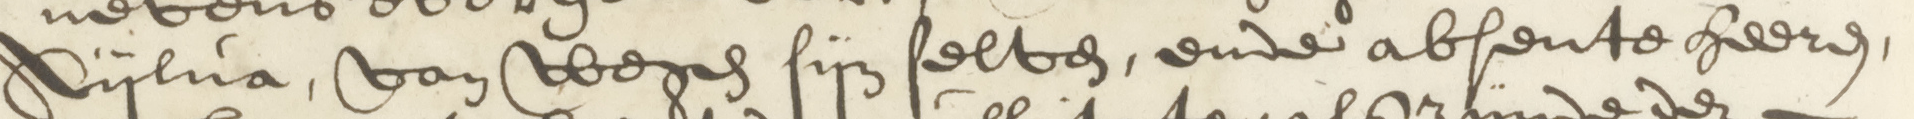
Aijlua, van wegen sijn selven, ende absente heeren
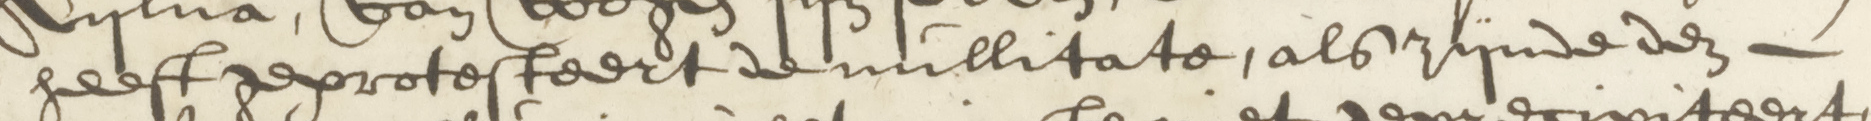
heeft geprotesteert te nullitate, als zijnde den —
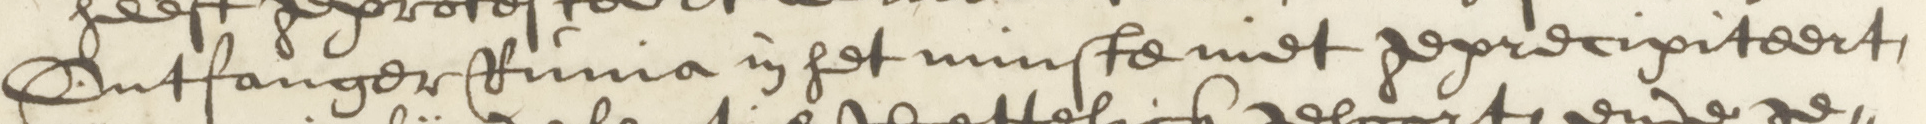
Ontfanger Runia in het minste niet geprecipiteert,
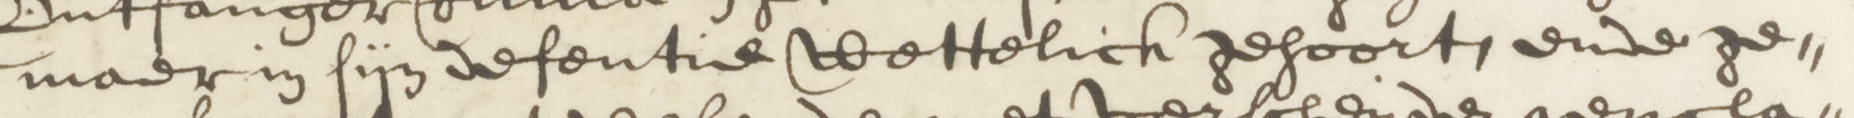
maer in sijn defentie wettelick gehoort, ende ge„
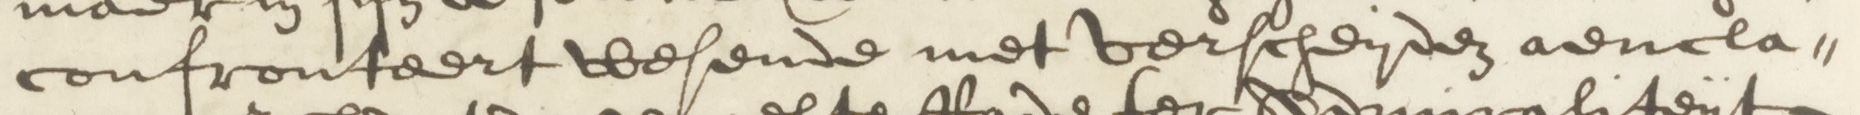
confronteert wesende met verscheijden aencla„
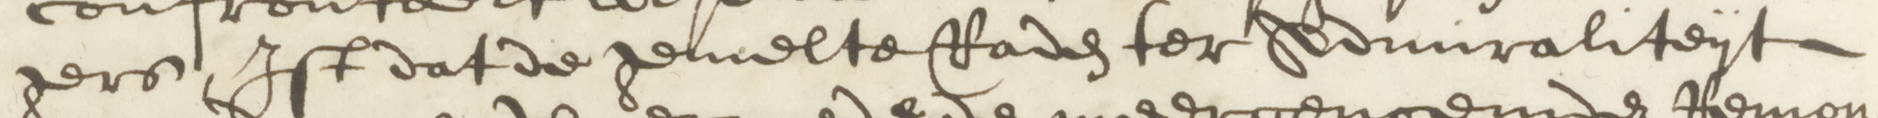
gers, Ist dat de gemelte Raden ter Admiraliteijt ¬
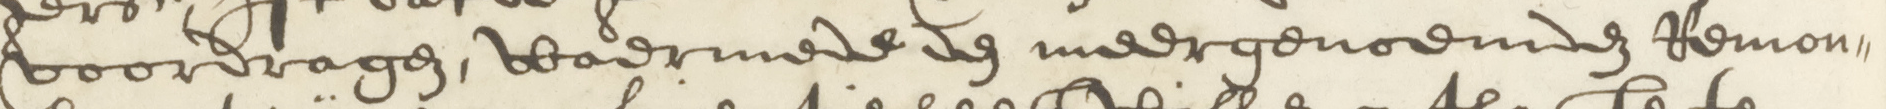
voordragen, waermede den meergenoemden Remon„
